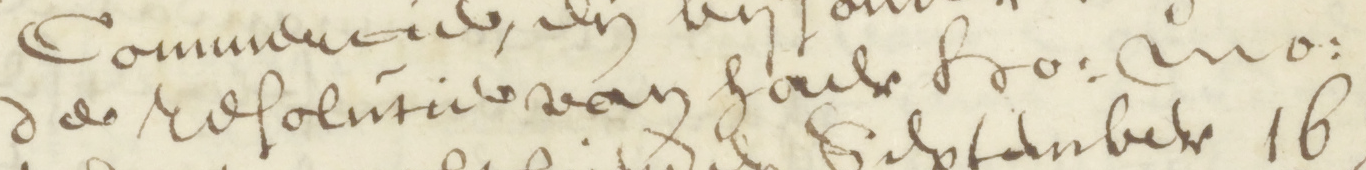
de resolutie van haer Ho:Mo:
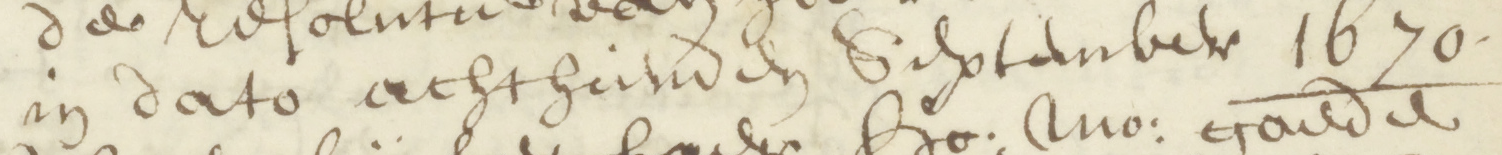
in dato achthienden September 1670
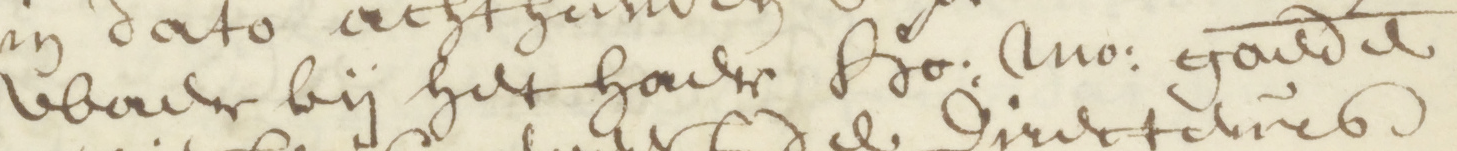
waer bij het haer Ho:Mo: goede
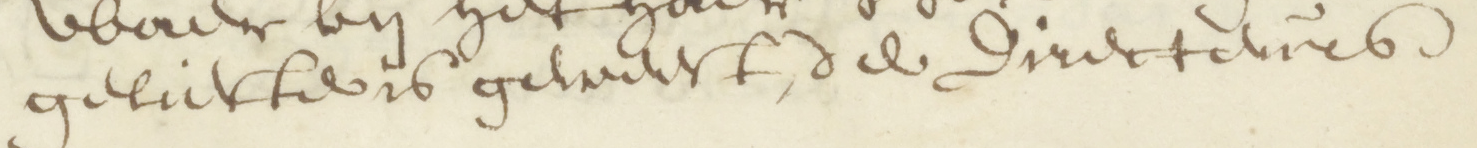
geliefte is geweest, de Directeurs
